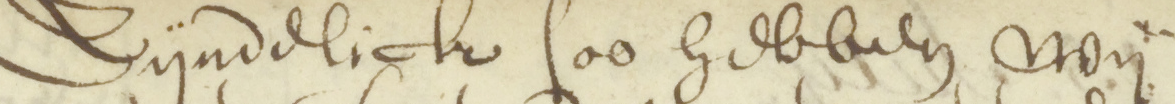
Eijndelick soo hebben wij
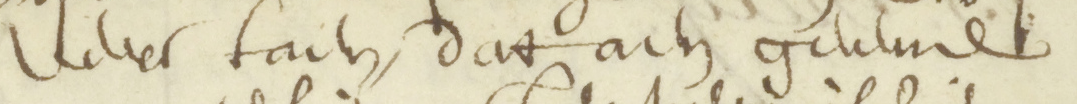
verstaen, dat aen geene
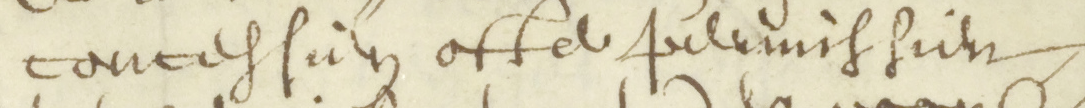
concessien ofte permissien
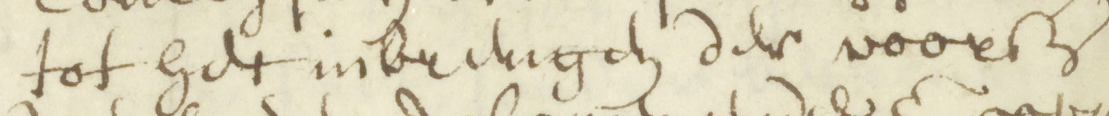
tot het inbrengen der voors
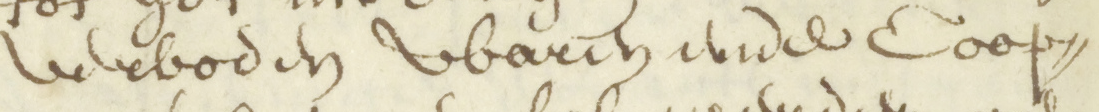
verboden waren ende Coop„
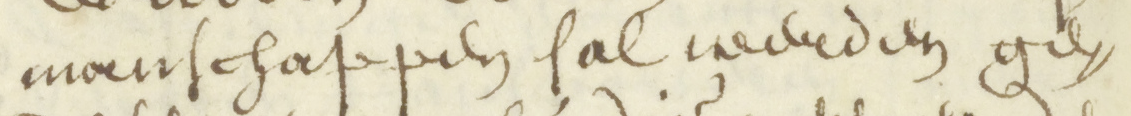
manschappen sal werden ge„
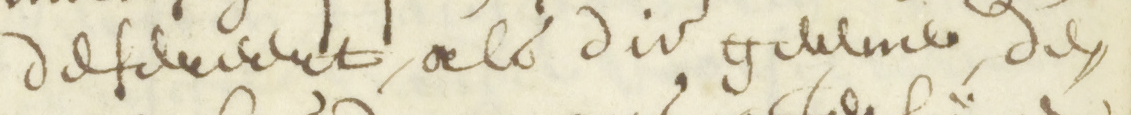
defereert, als die geene de„
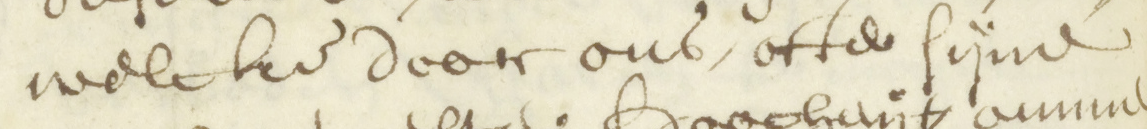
welcke door ons, ofte sijne
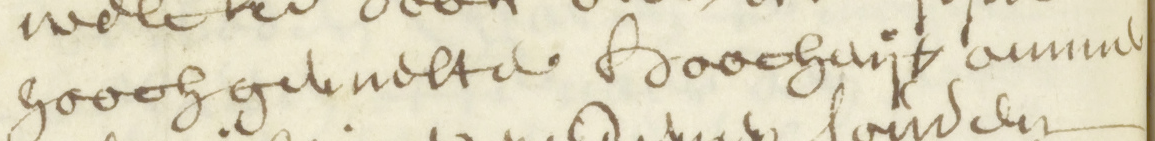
hoochgemelte Hoocheijt omme
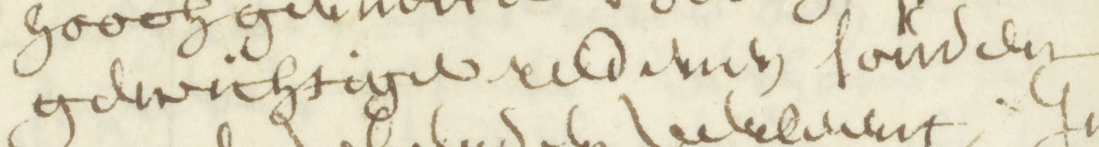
gewichtige redenen souden
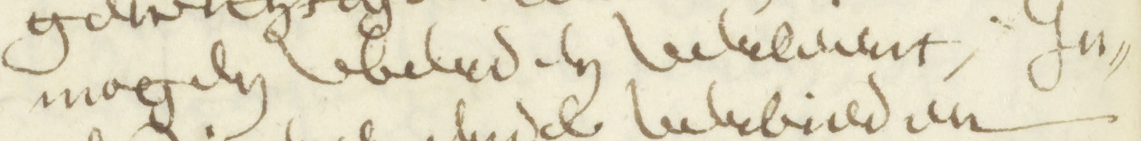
mogen werden verleent, In„
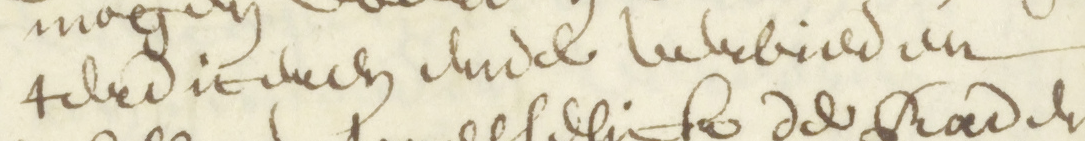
terdiceren ende verbieden
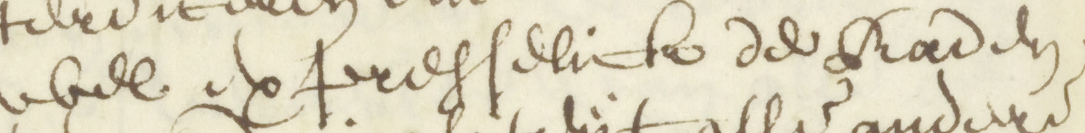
wel expresselick de Raden
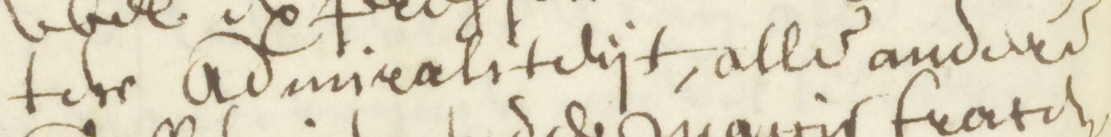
ter Admiraliteijt, alle andere
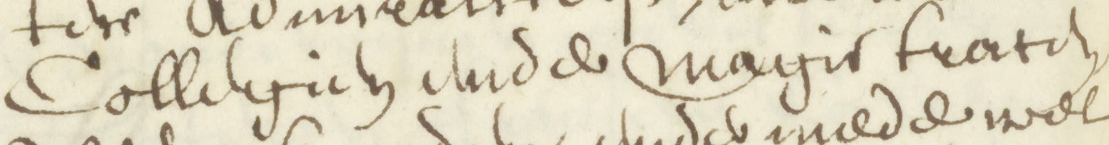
Collegien ende magistraten
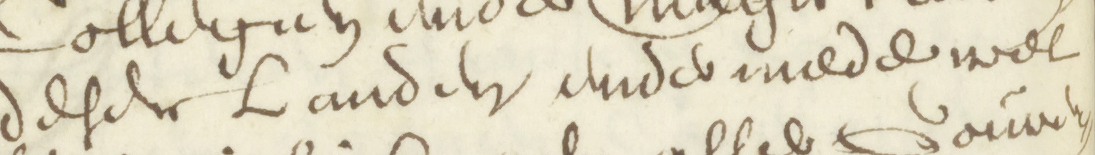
deser Landen, ende mede wel
